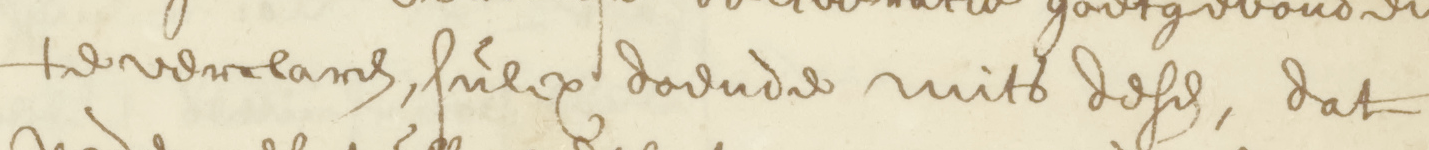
te verclaren, sulcx doende mits desen, dat
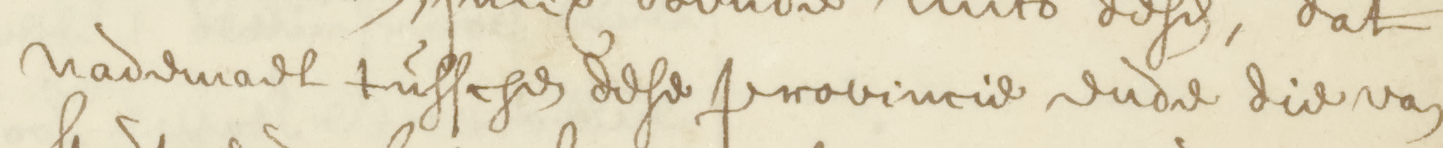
nademael tusschen dese Provincie ende die van
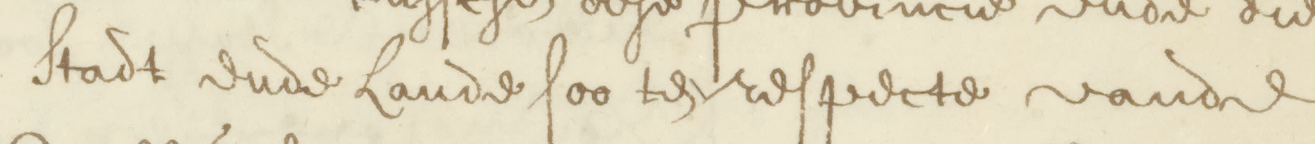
Stadt ende Lande soo ten respecte vande
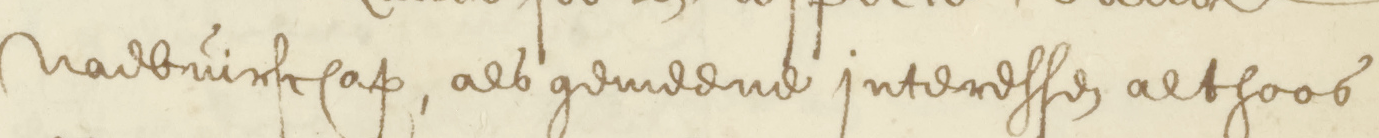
naebuirschap als gemeene interessen althoos
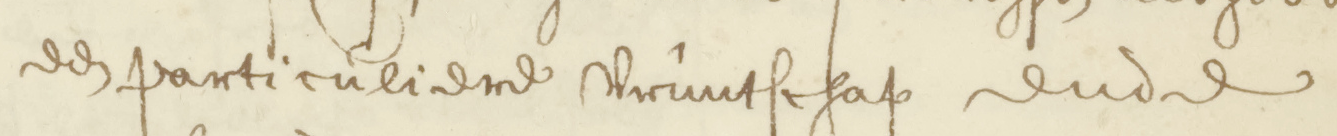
een particuliere Vruntschap ende
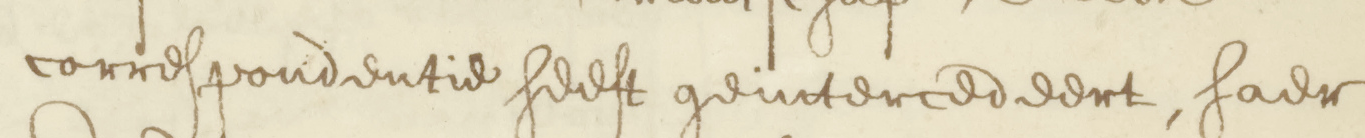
correspondentie heeft geintercedeert, haer
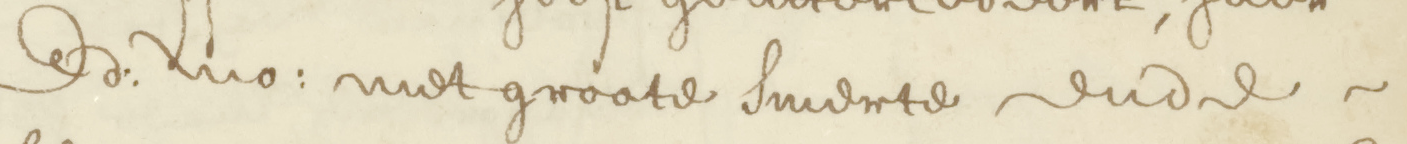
Ed:Mo: met groote smerte ende
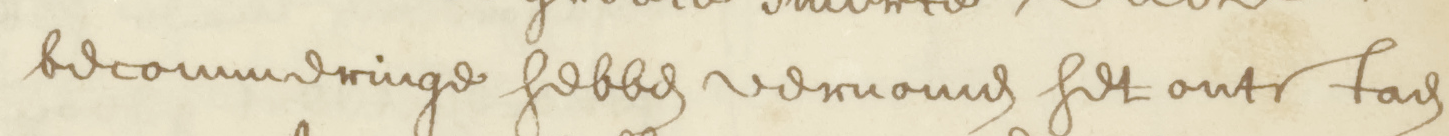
becommeringe hebben vernomen het ontstaen
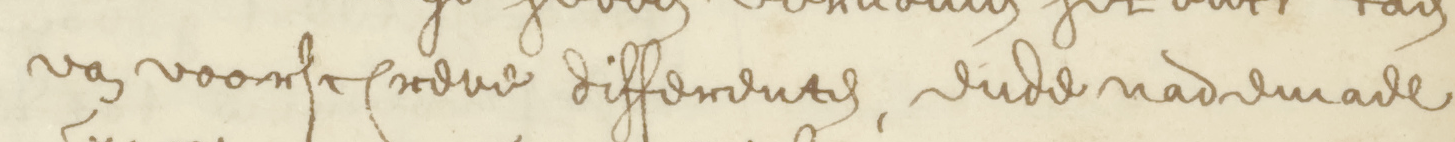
van voorschreve differenten, ende nademael
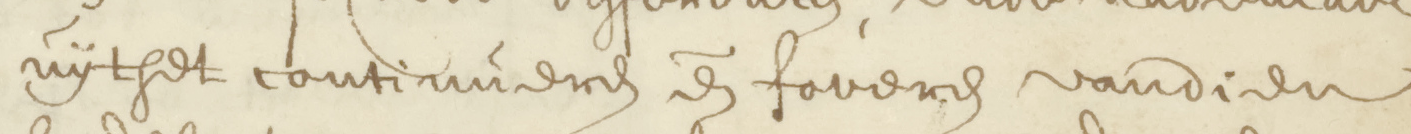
uijt het continueren en foveren vandien
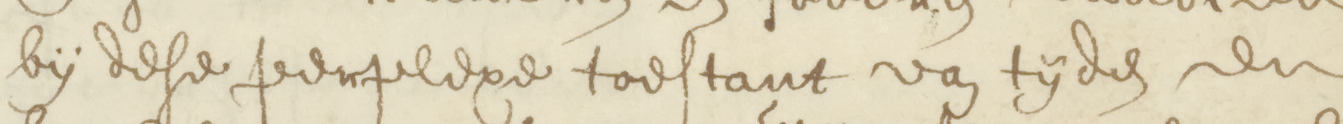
bij dese perplexe toestant van tijden en
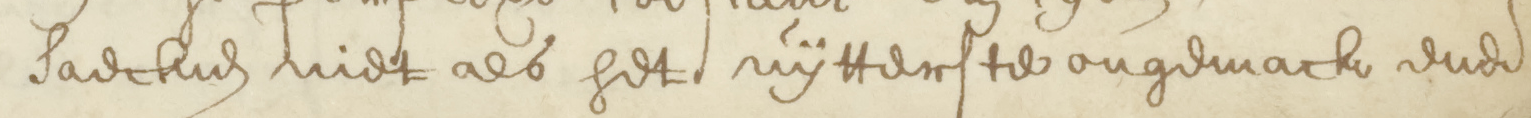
Saecken niet als het uijtterste ongemack ende
